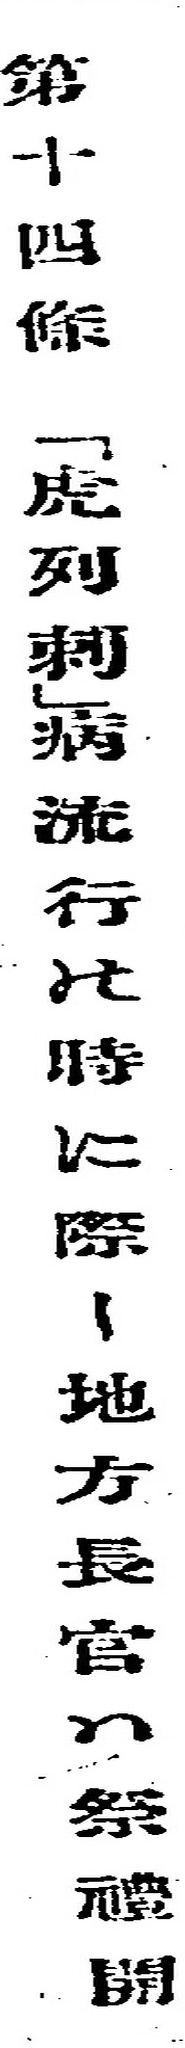第十四条「虎列刺」病流行の時に際し地方長官は祭礼開
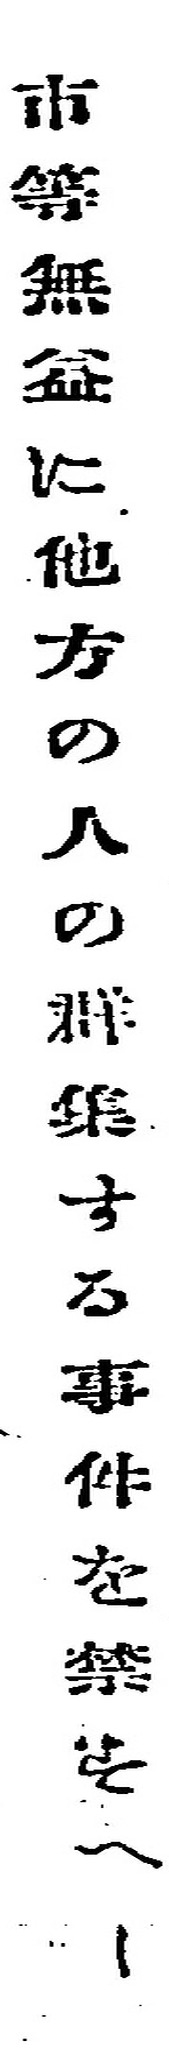市等無益に他方の人の群集する事件を禁すへし
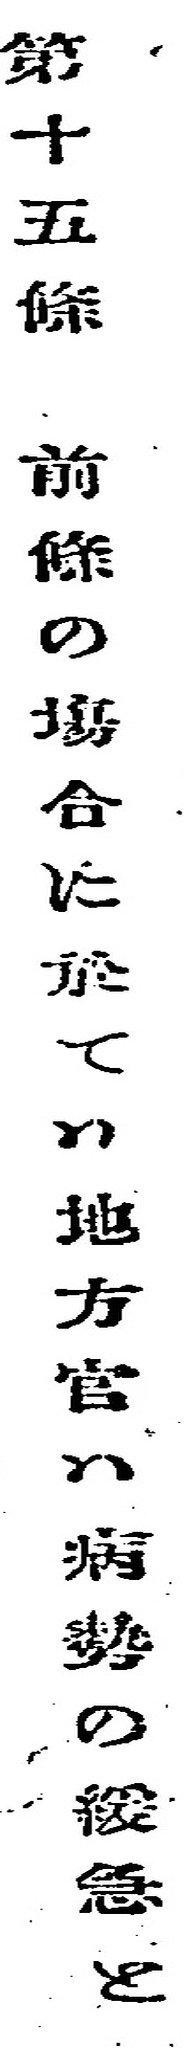第十五条前条の場合に於ては地方官は病勢の緩急と
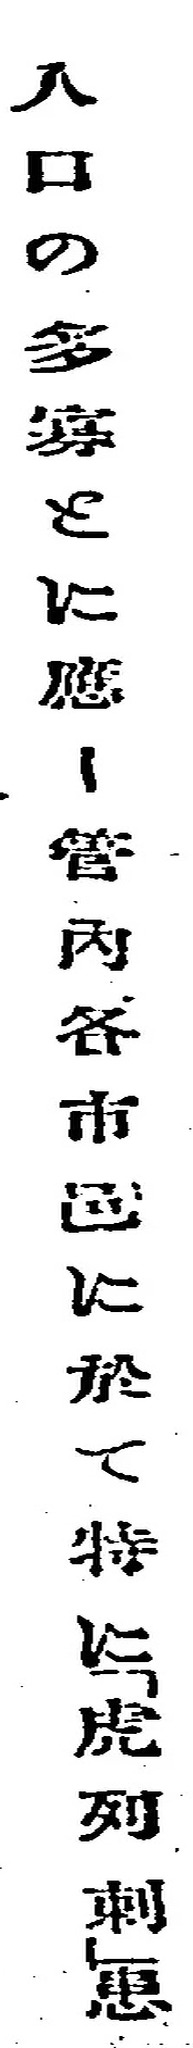人口の多寡とに応し管内各市邑に於て特に「虎列刺」患
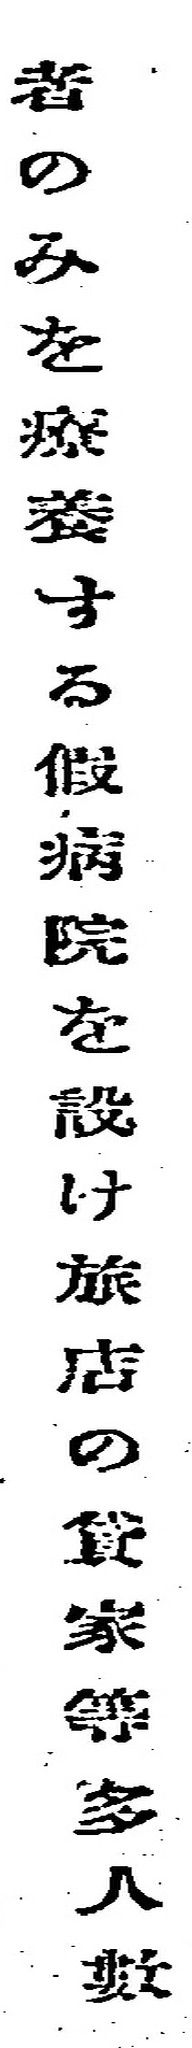者のみを療養する仮病院を設け旅店の貸家等多人数
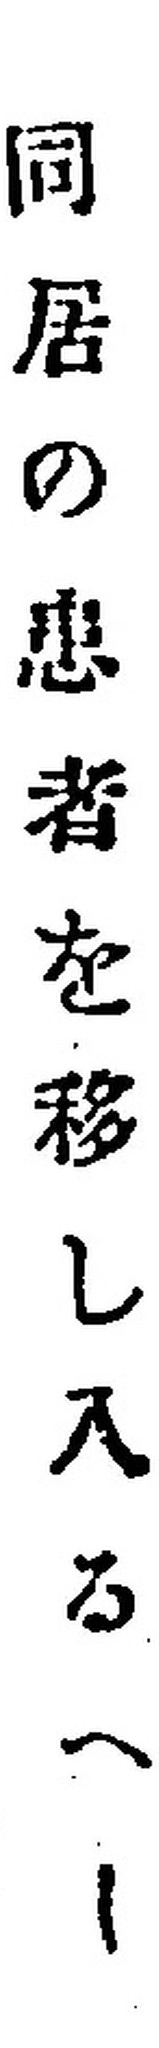同居の患者を移し入るへし
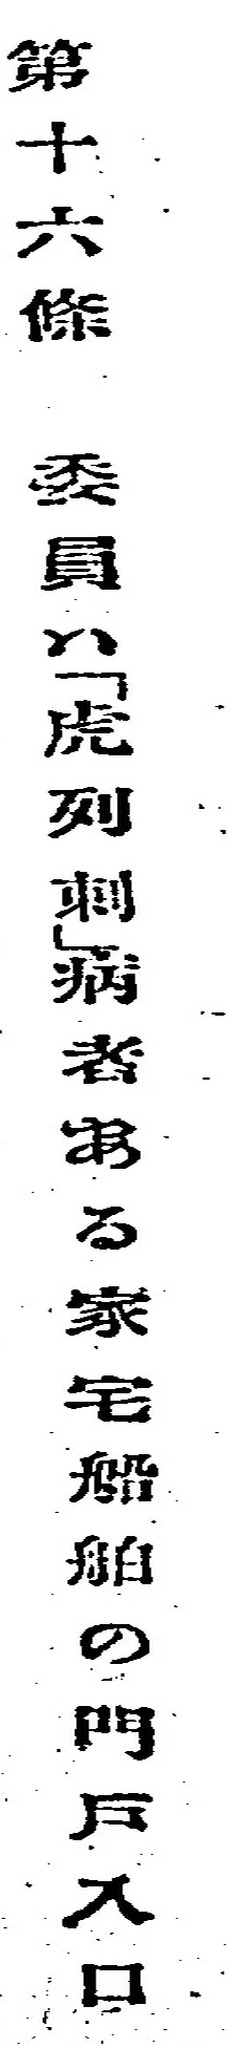第十六条委員は「虎列刺」病者ある家宅船舶の門戸入口
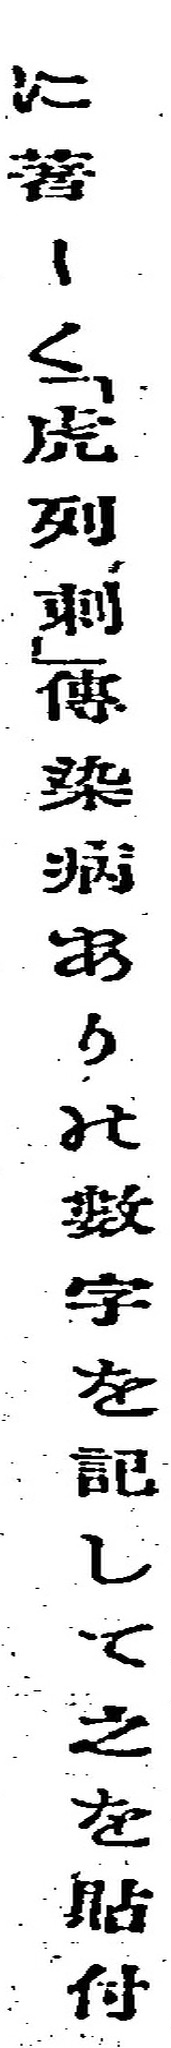に著しく「虎列刺」伝染病ありの数字を記して之を貼付
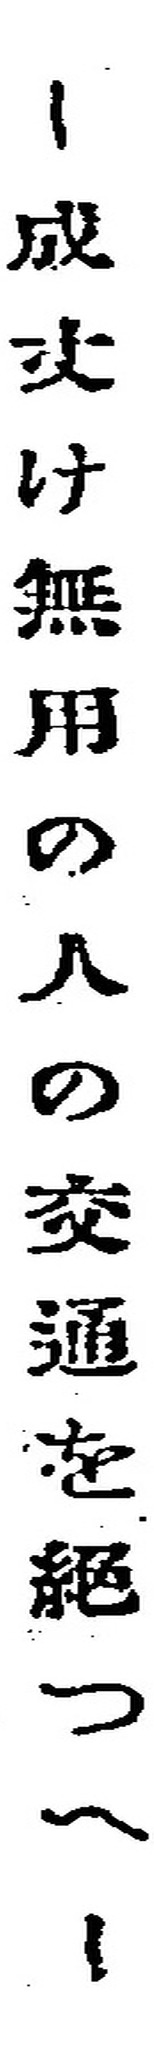し成丈無用の人の交通を絶つへし
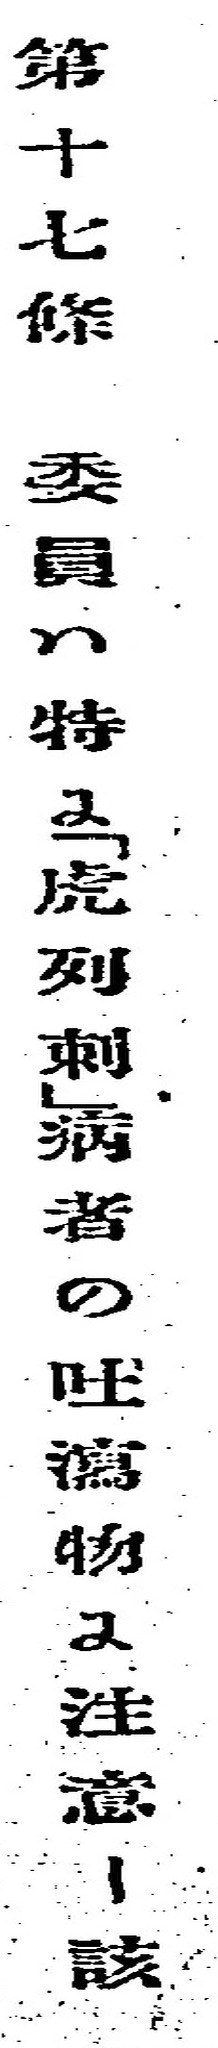第十七条委員は特に「虎列刺」病者の吐瀉物に注意し該
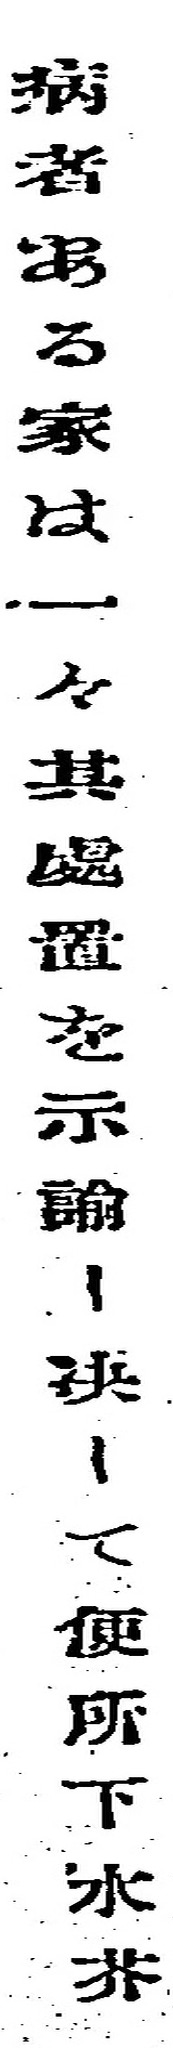病者ある家は一々其処置を示諭し決して便所下水芥
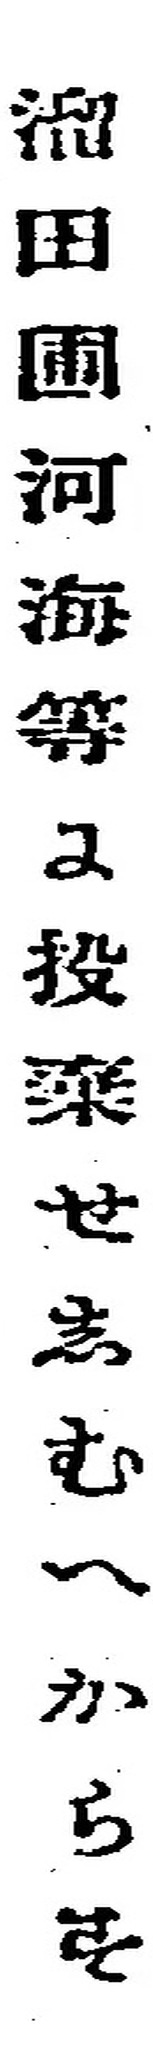溜田圃河海等に投棄せしむへからす
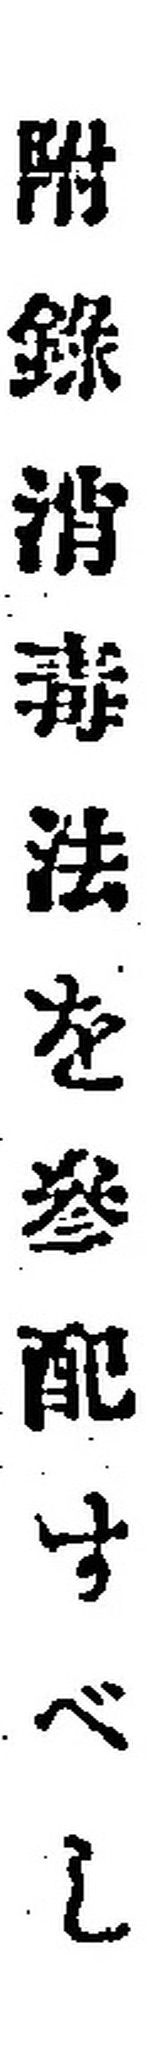附録消毒法を参配すべし
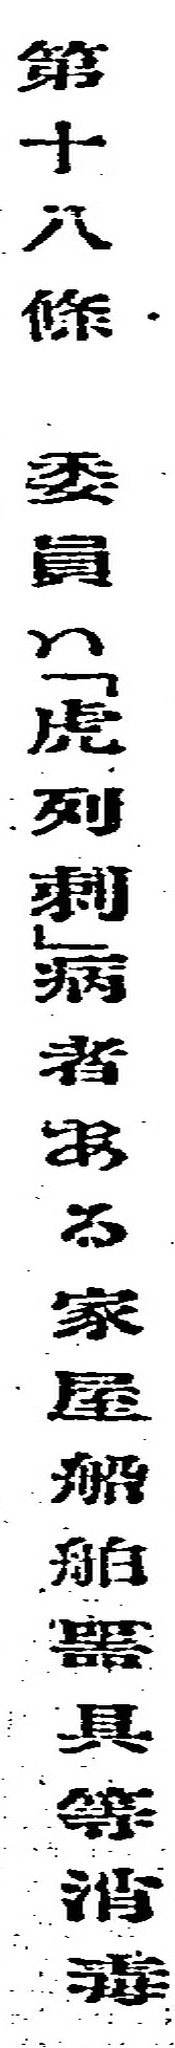第十八条委員は「虎列刺」病者ある家屋船舶器具等消毒
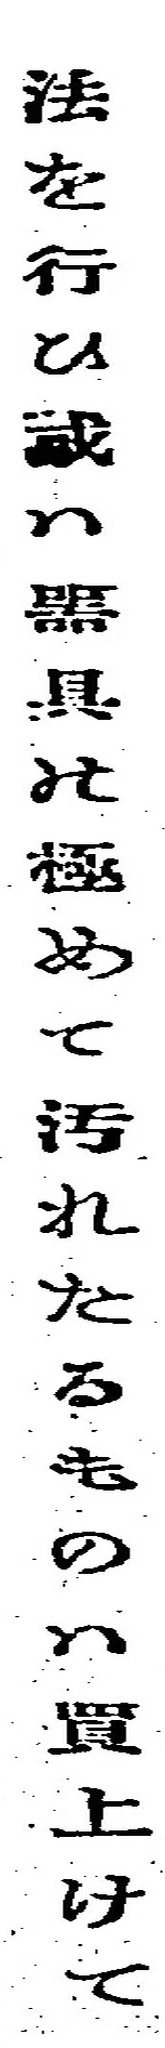法を行ひ或は器具の極めて汚れたるものは買上けて
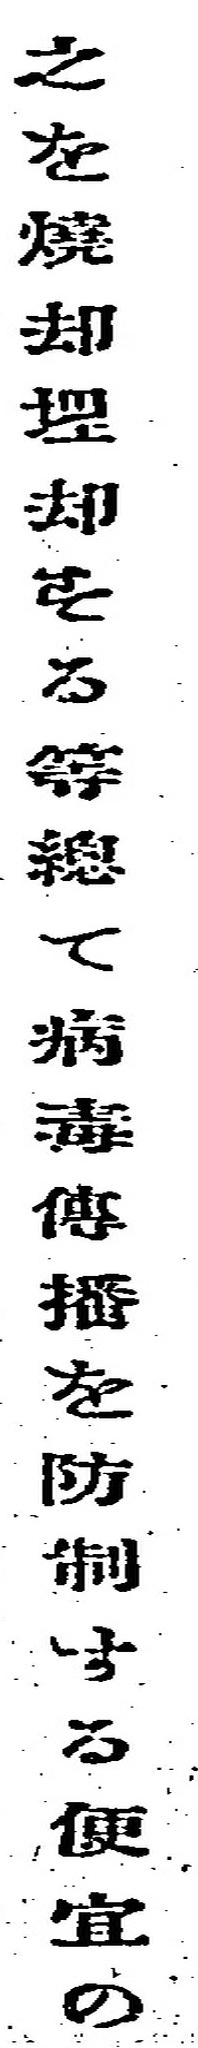之を焼却埋却する等総て病毒伝播を防制する便宜の
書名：これら病予防心得
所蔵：国立国会図書館 National Diet Library, JAPAN
